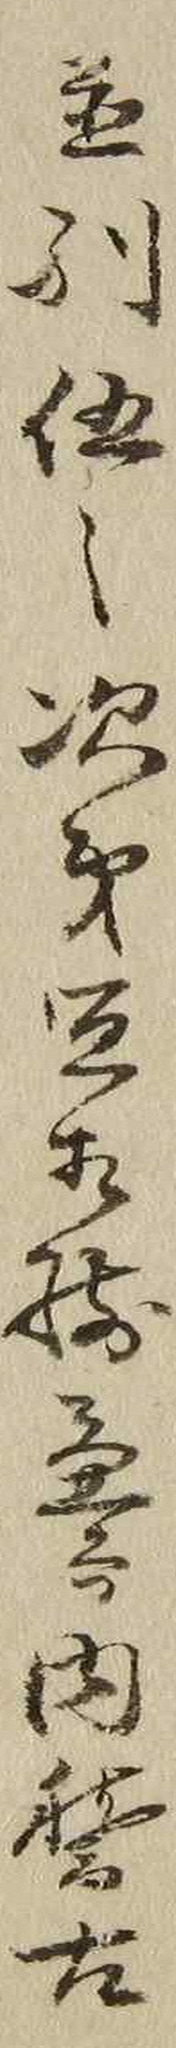並列伍次第宜相揃兼而内稽古
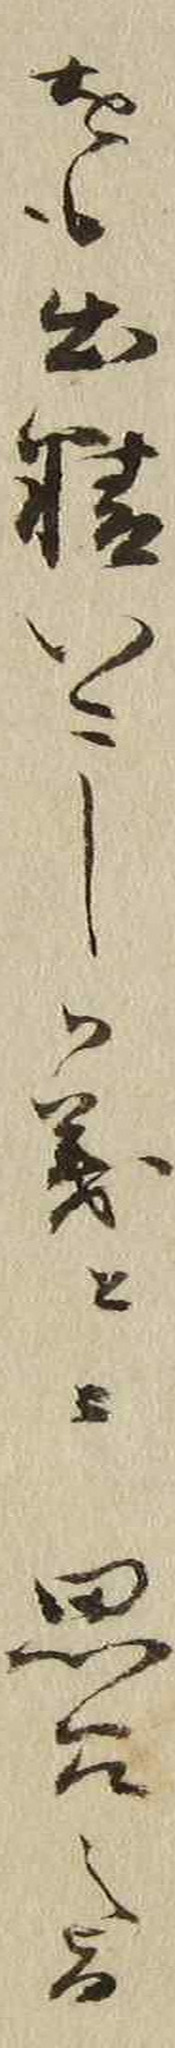をも出精いたし候義と被思召之旨
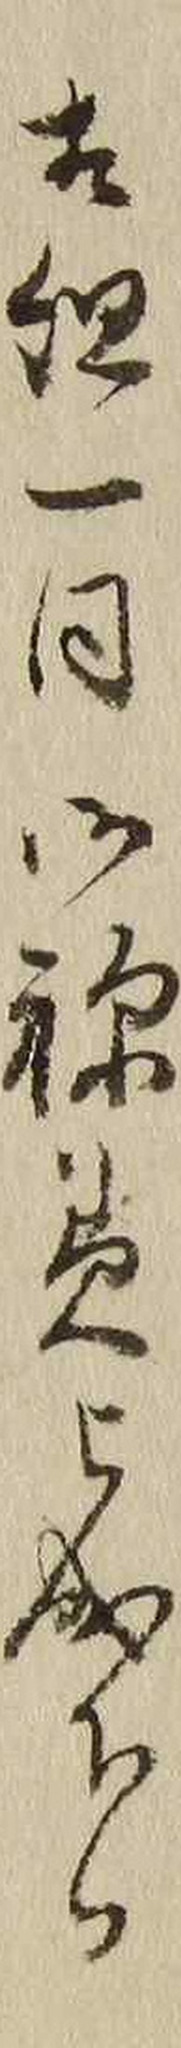相組一同御称美被成下候事
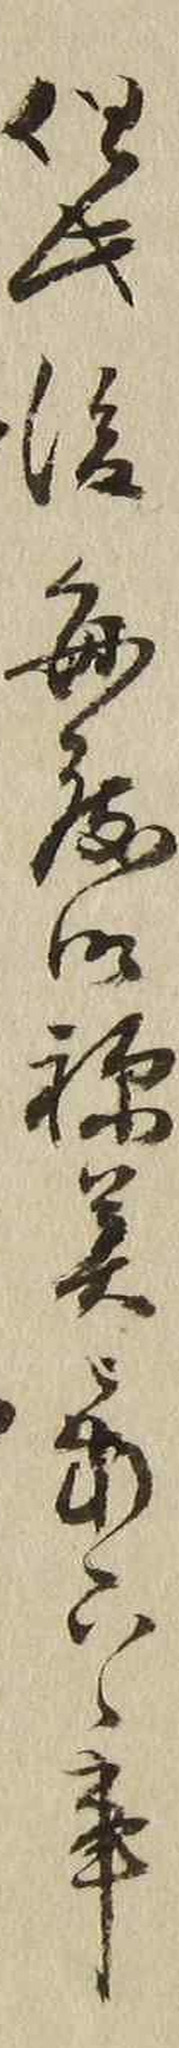但此後毎度御称美被成下候事
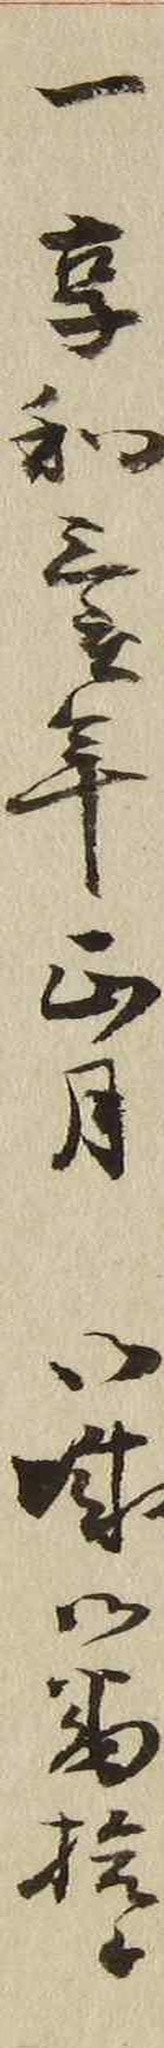一享和三亥年正月御城御番拾ケ
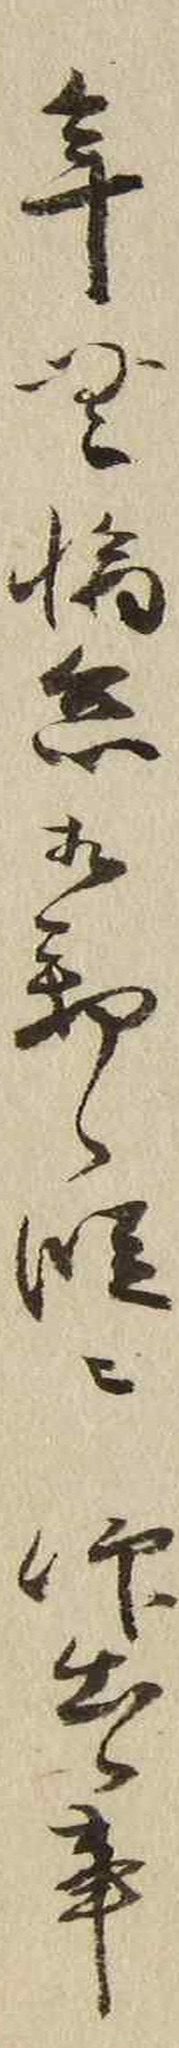年無懈怠相勤候段被仰出候事
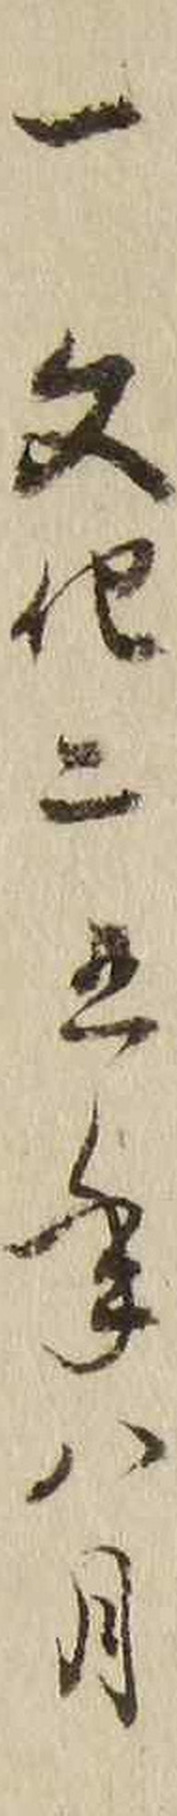一文化二丑年八月
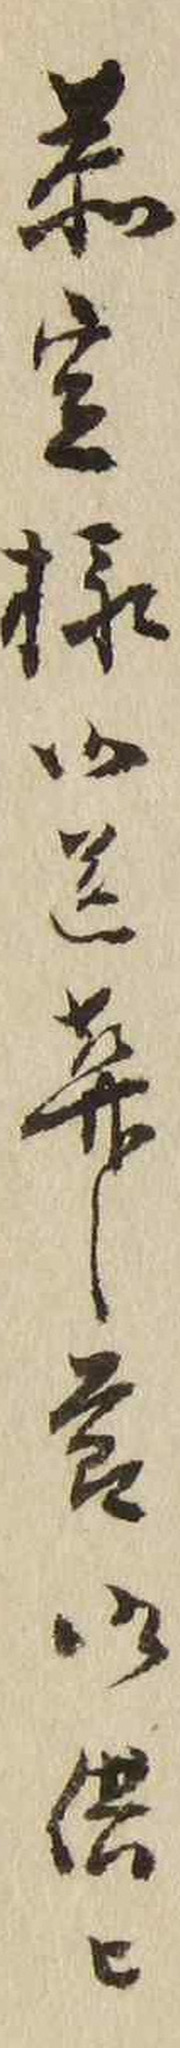恭定様御送葬之節御供被

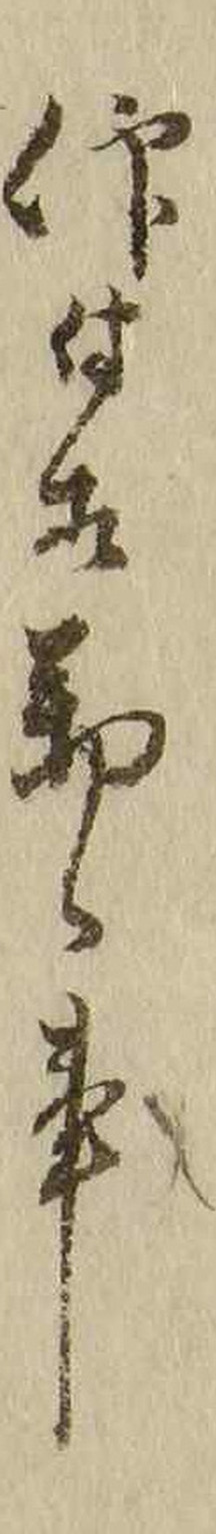仰付相勤候事
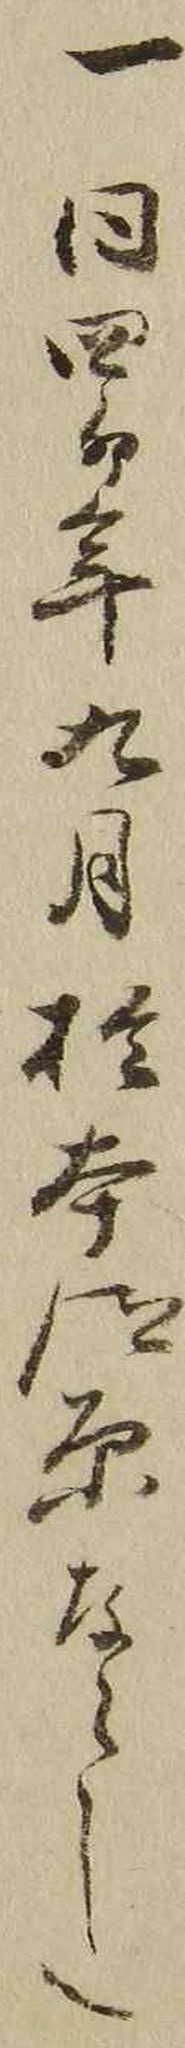一同四卯年九月於本郷原ならし之
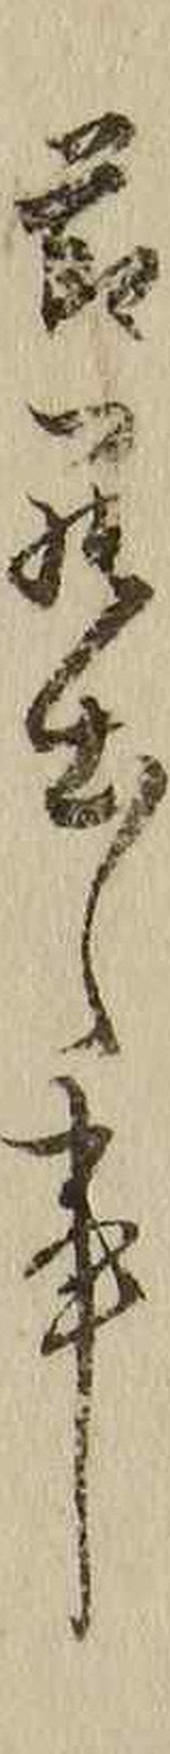節罷出候事
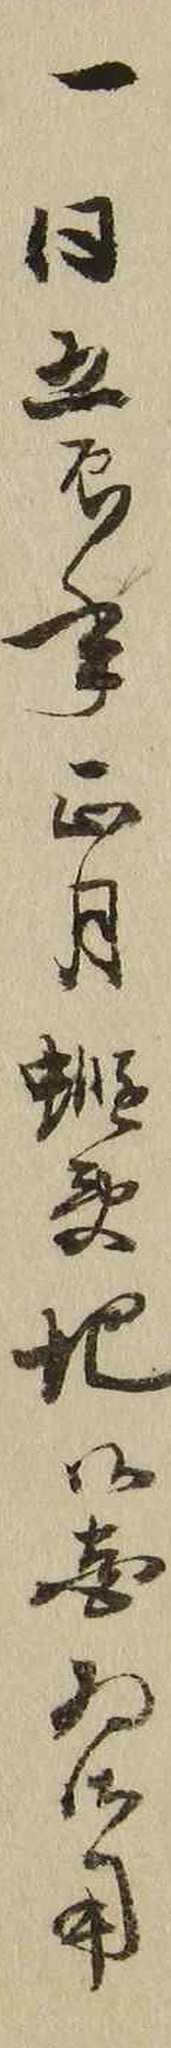一同五辰年正月蝦夷地御固為御用
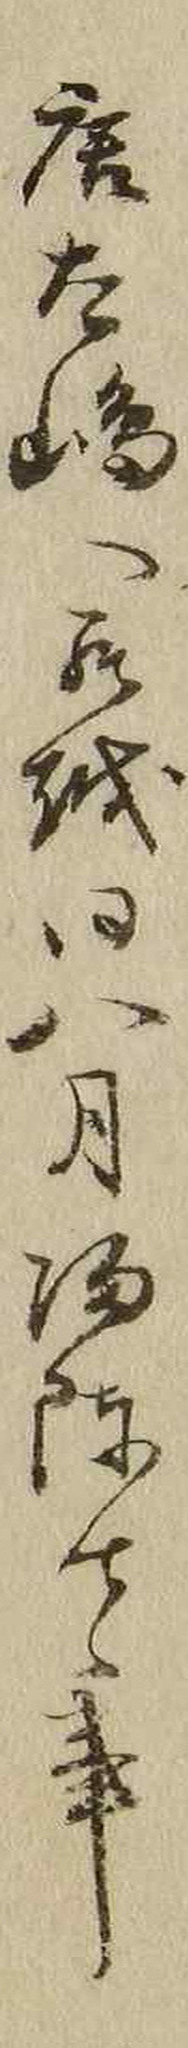唐太島へ罷越同八月帰陳仕候事
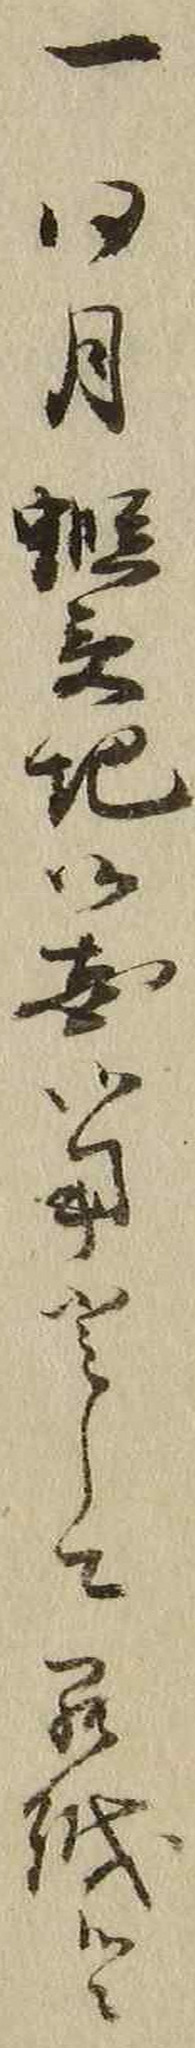一同月蝦夷地御固御用として罷越候ニ
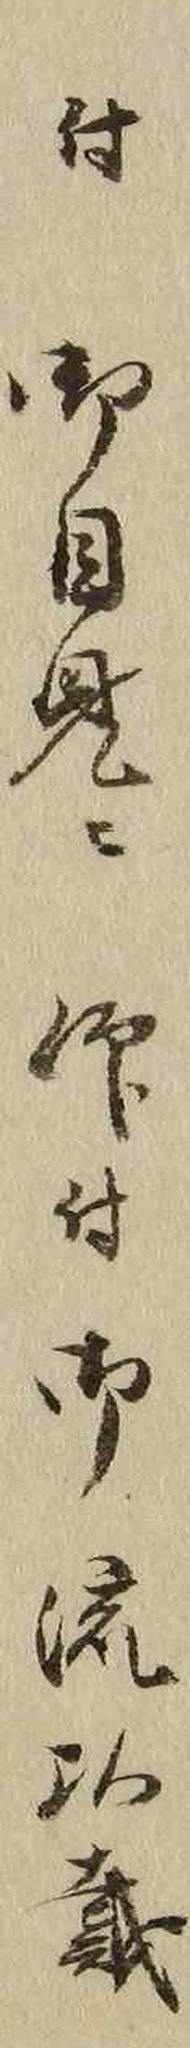付御目見被仰付御流頂戴
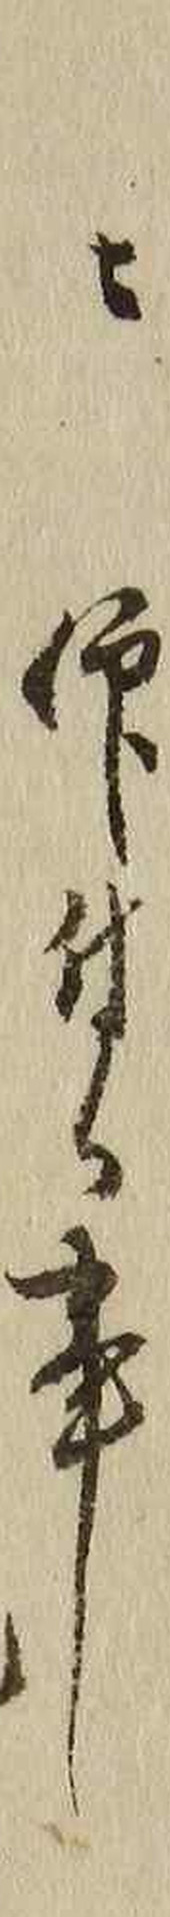被仰付候事
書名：諸士系譜　巻之232　け之部1
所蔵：会津若松市立会津図書館
